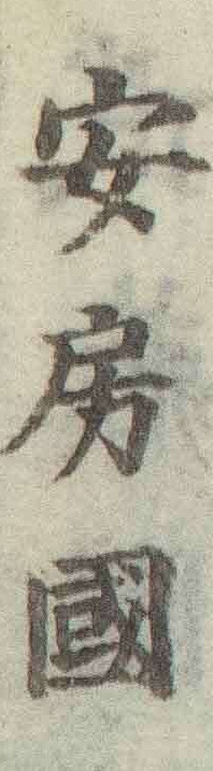安房国

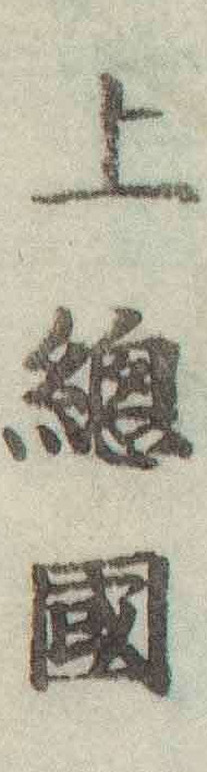上総国

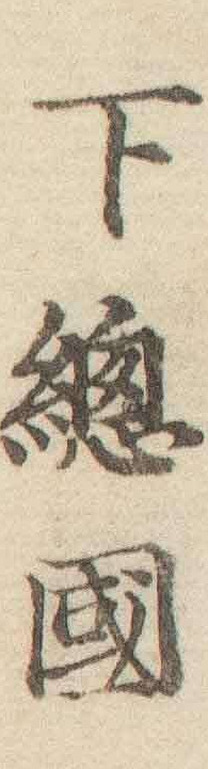下総国
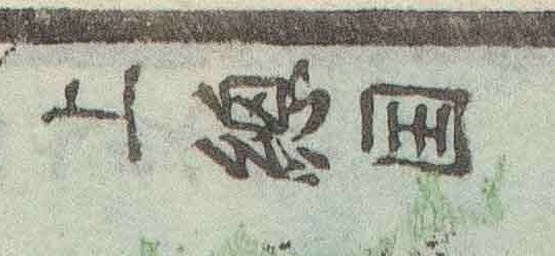下総国
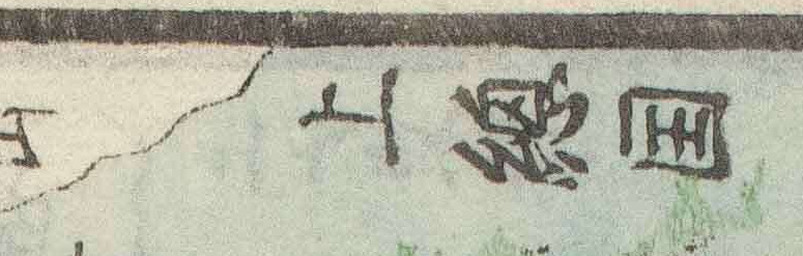下総国

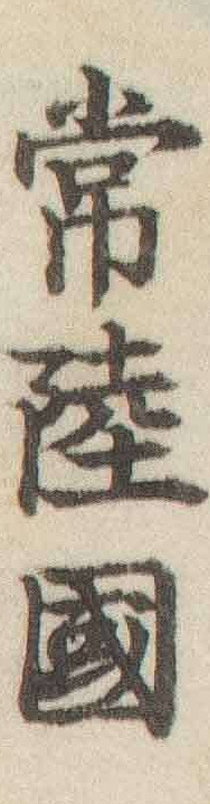常陸国

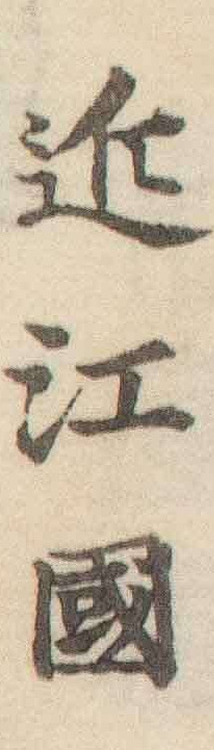近江国

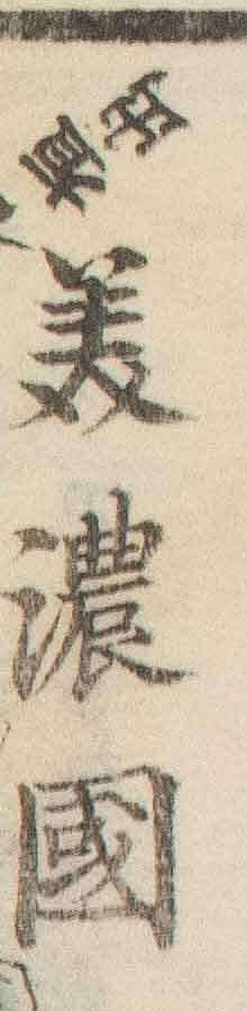美濃国

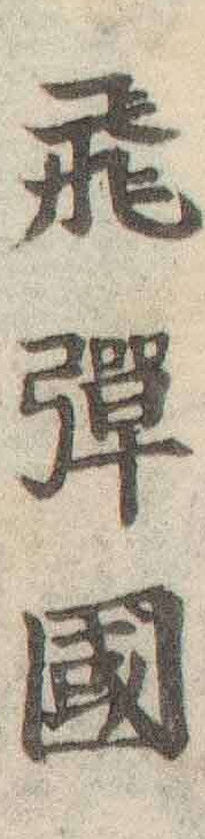飛騨国

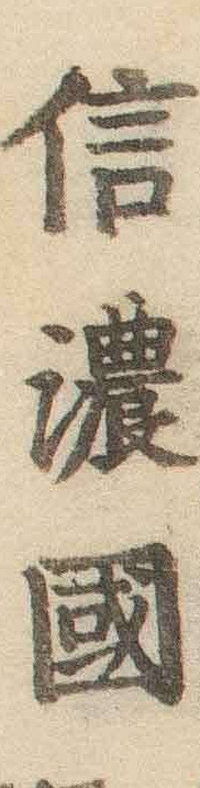信濃国

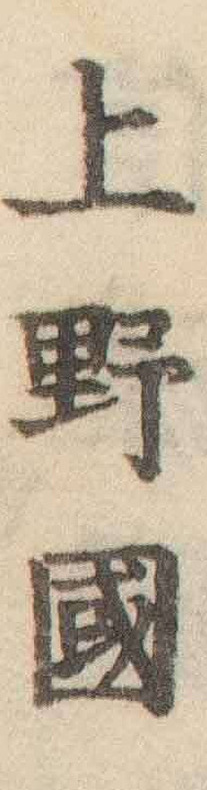上野国

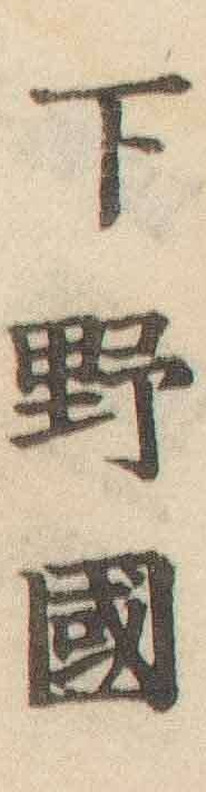下野国
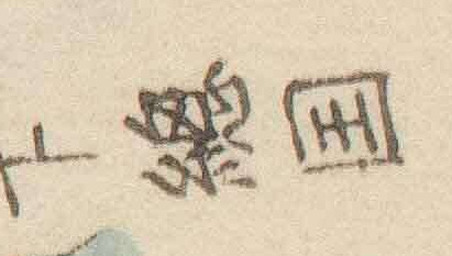下野国
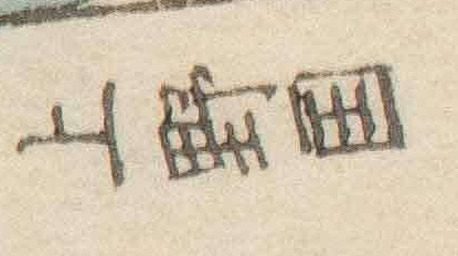下野国
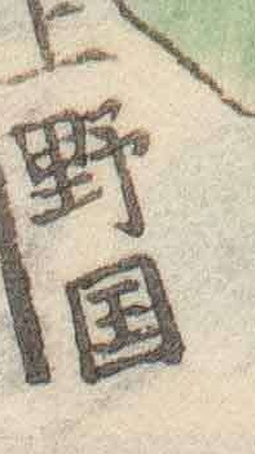下野国

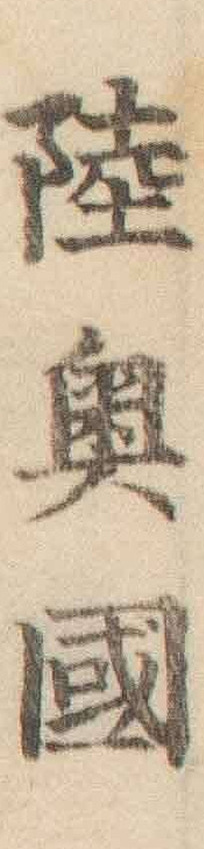陸奥国
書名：国郡全図
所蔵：東京学芸大学附属図書館 国文学研究資料館
